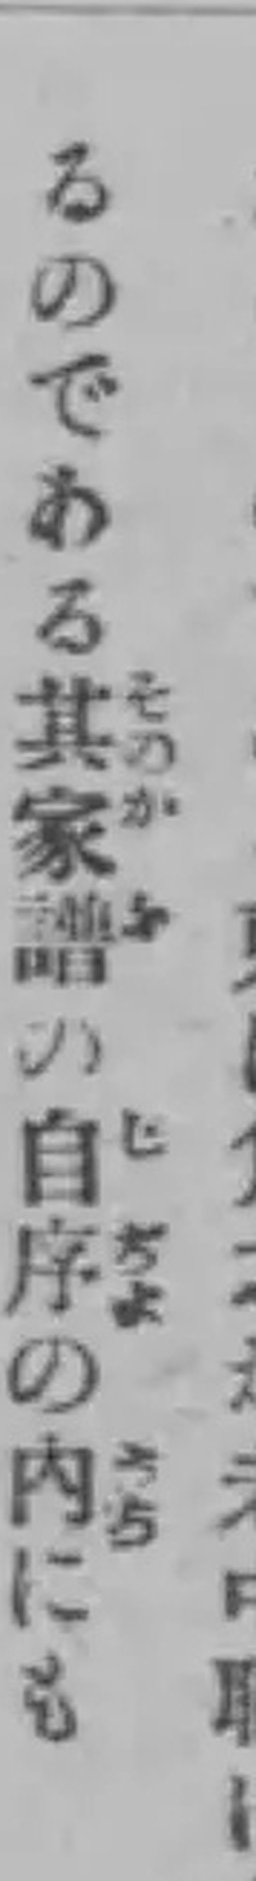るのである其家譜の自序の内にも
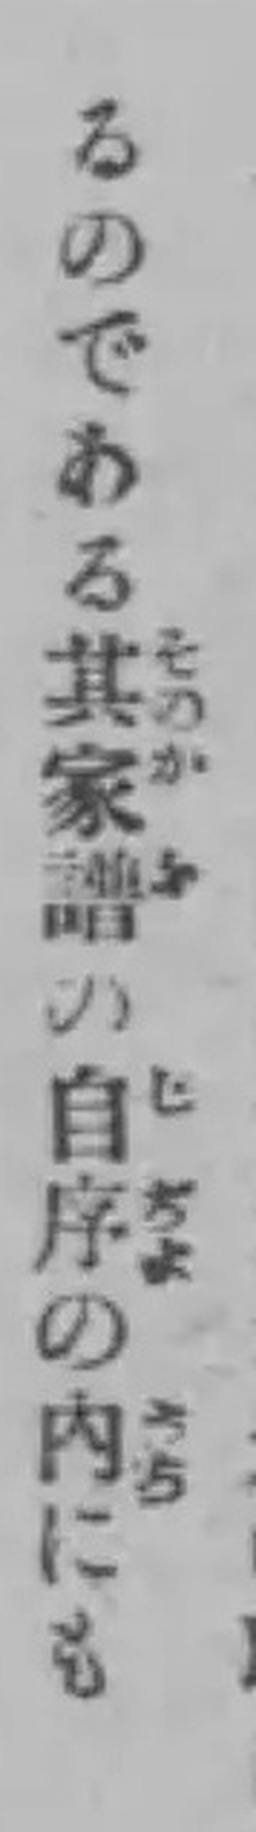るのである其家譜の自序の内にも
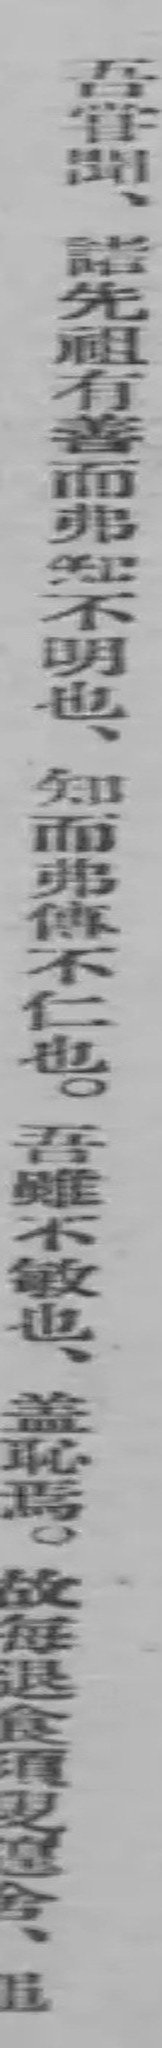吾嘗聞、諸先祖有善而弗知不明也、知而弗伝不仁也。吾難不敏也、盖恥焉。故毎退食須臾遑舎、黽
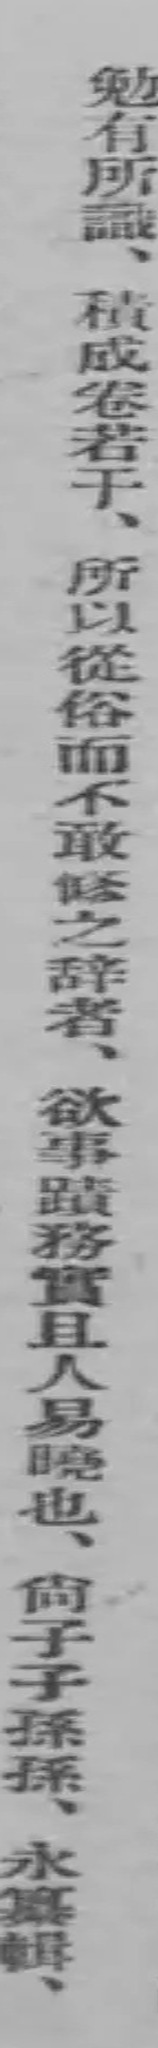勉有所識、積成巻若干、所以従俗而不敢修之辞者、欲事蹟務実且人易膮也、尚子子孫孫、永纂輯、
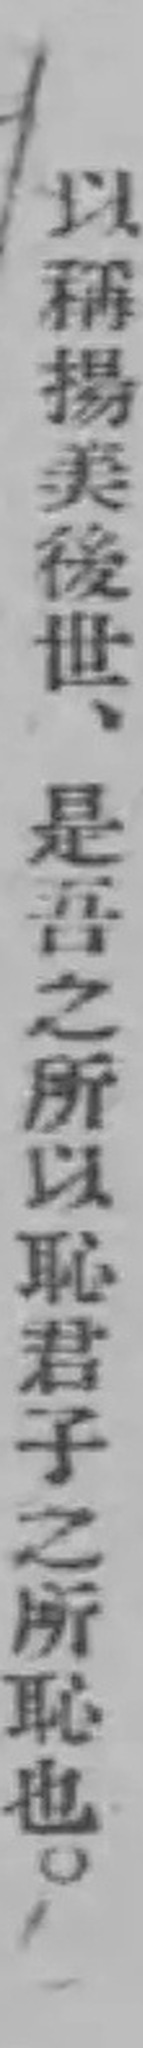以称揚美後世、是吾之所以恥君子之所恥也。
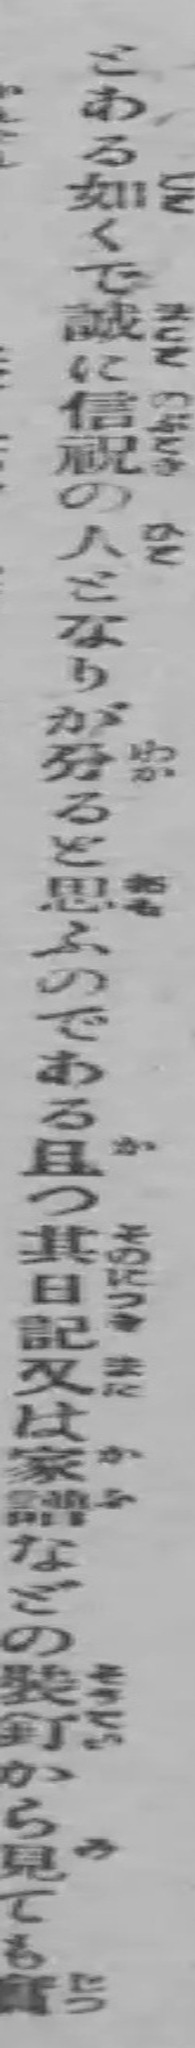とある如くで誠に信祝の人となりが分ると思ふのである且つ其日記又は家譜などの装釘から見ても実
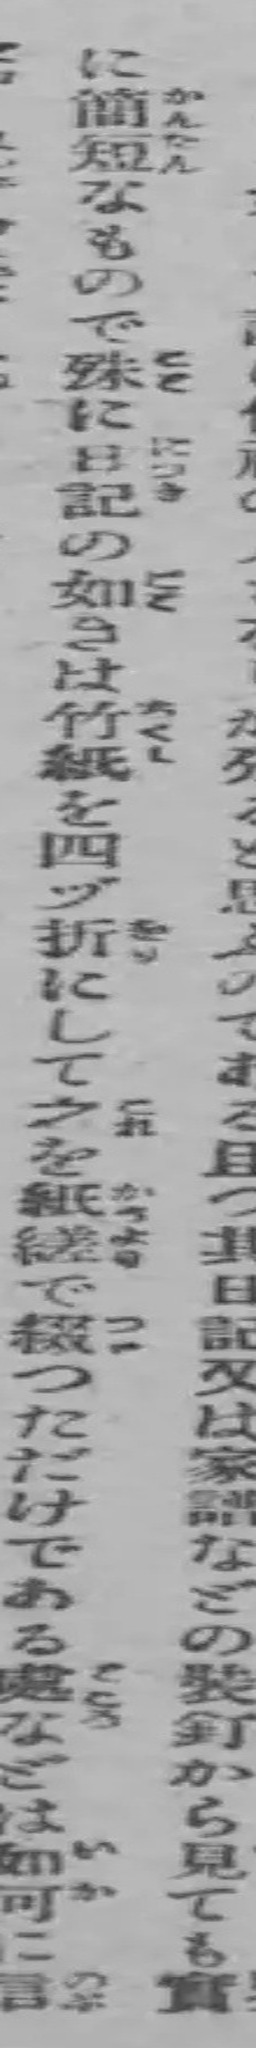に簡短なもので殊に日記の如きは竹紙を四ツ折にして之を紙縒で綴つただけである処などは如何に信
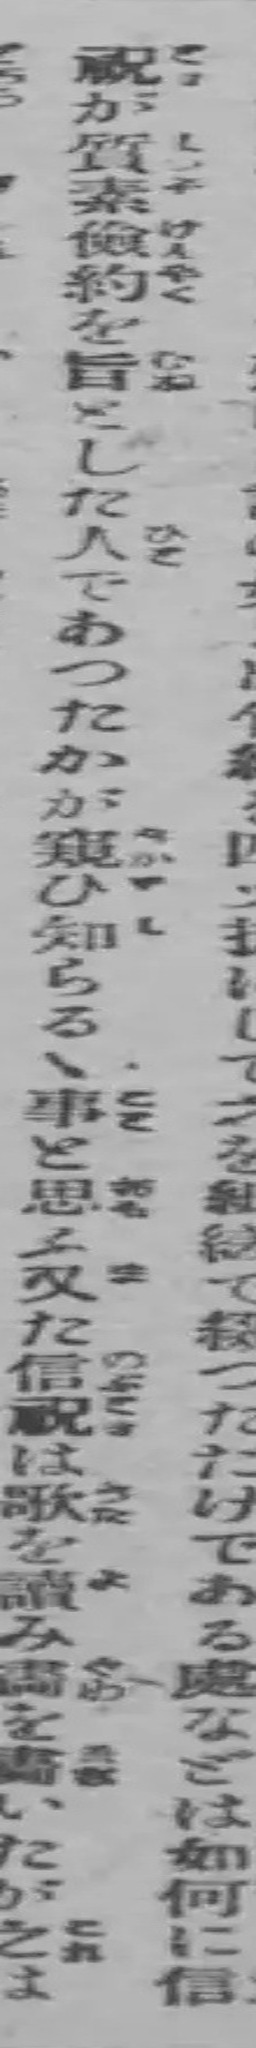祝が質素倹約を旨とした人であつたかが窺ひ知らるゝ事と思ふ又た信祝は歌を読み画を画いたが之は
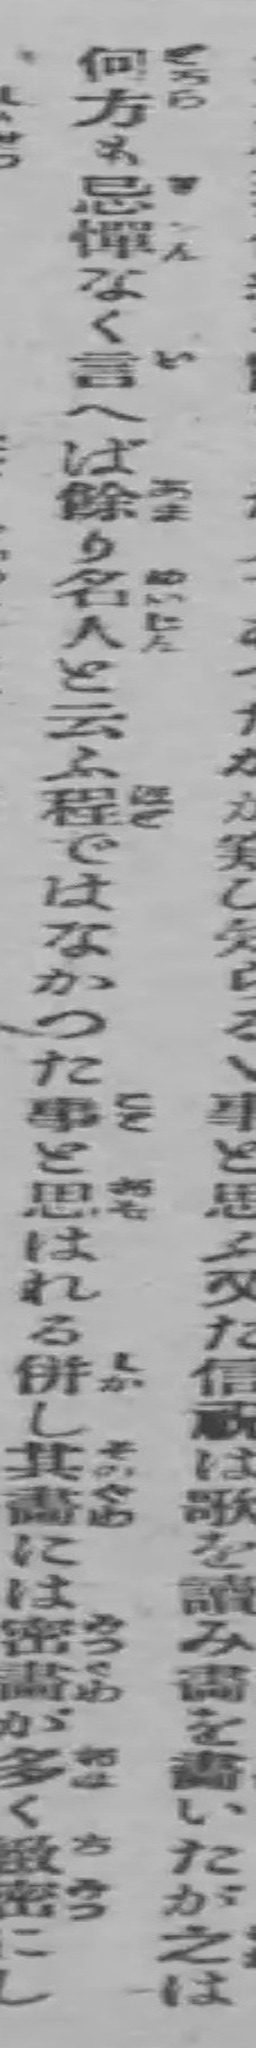何方も忌憚なく言へば余り名人と云ふ程ではなかつた事と思はれる併し其画には密画が多く緻密にし
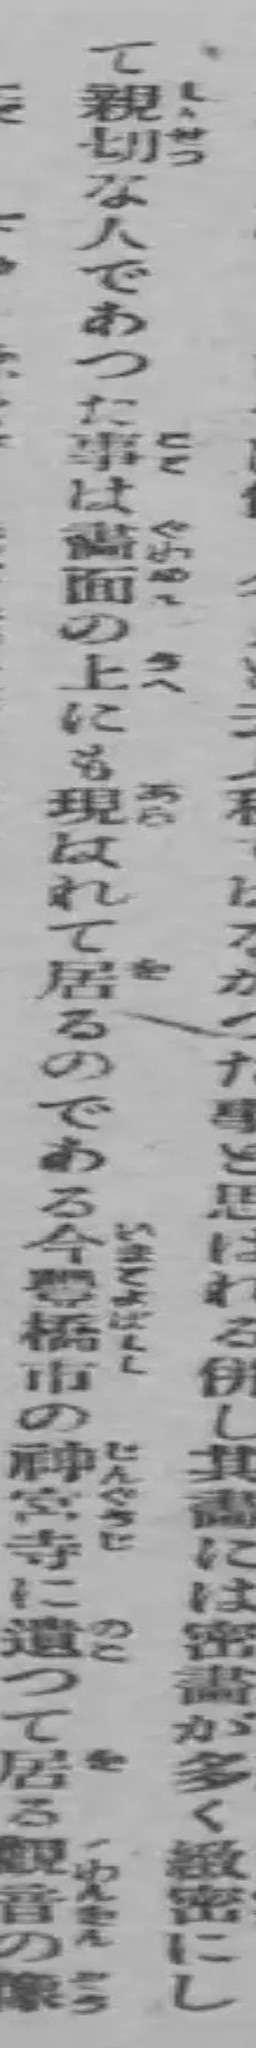て親切な人であつた事は画面の上にも現はれて居るのである今豊橋市の神宮寺に遺つて居る観音の像
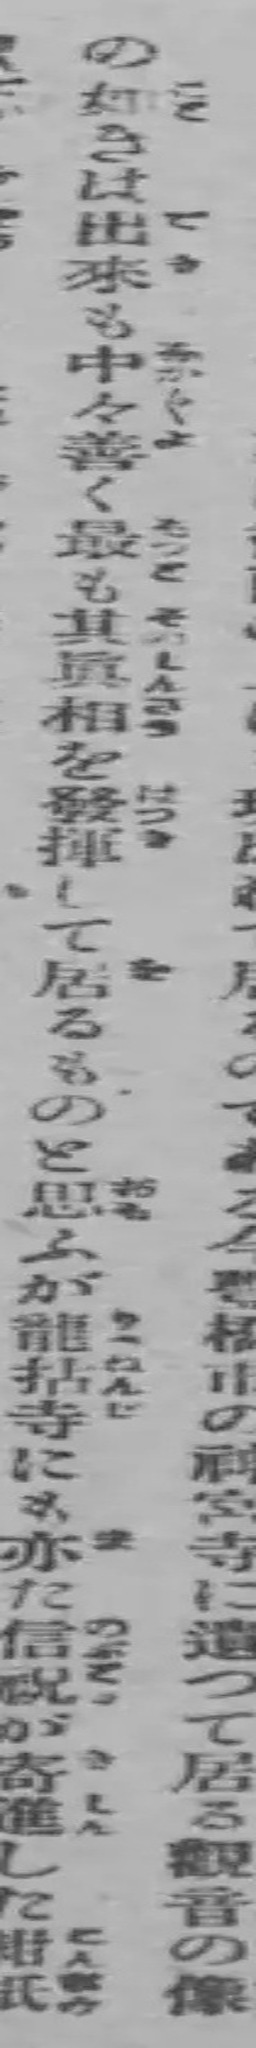の如きは出来も中々善く最も其真相を発揮して居るものと思ふが龍拈寺にも亦た信祝が寄進した紺紙
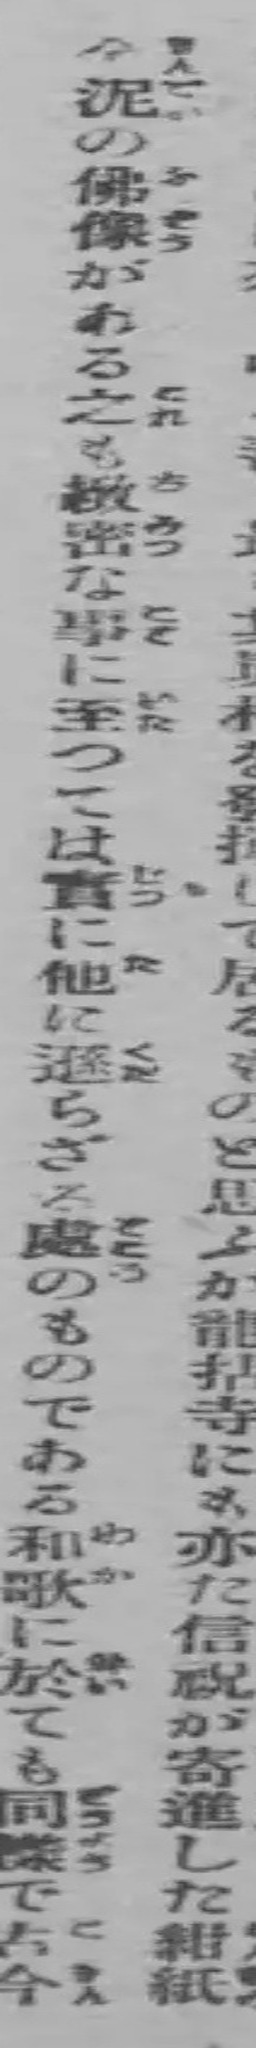金泥の仏像がある之も緻密な事に至つては実に他に遜らざる処のものである和歌に於ても同様で古今
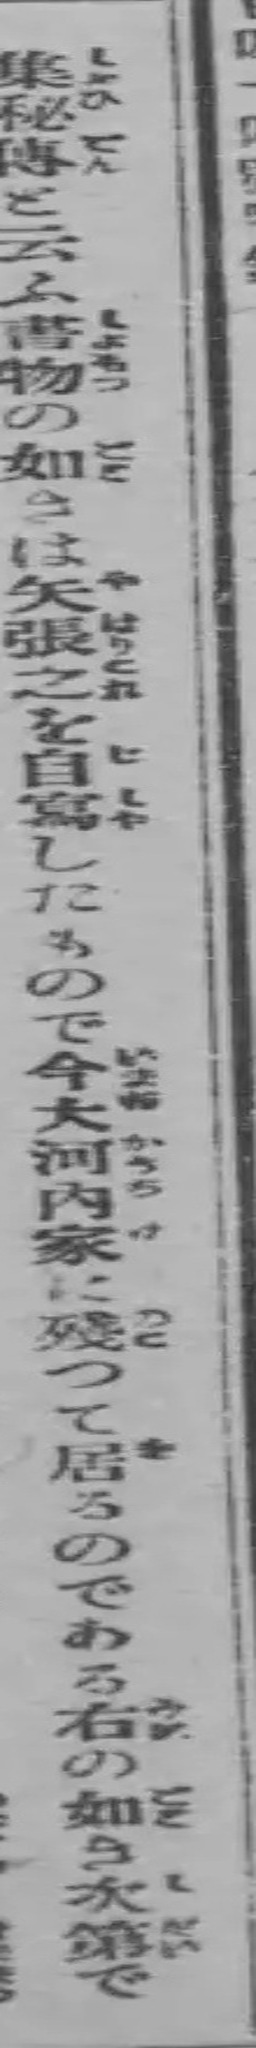集秘伝と云ふ書物の如きは矢張之を自写したもので今大河内家に残つて居るのである右の如き次第で
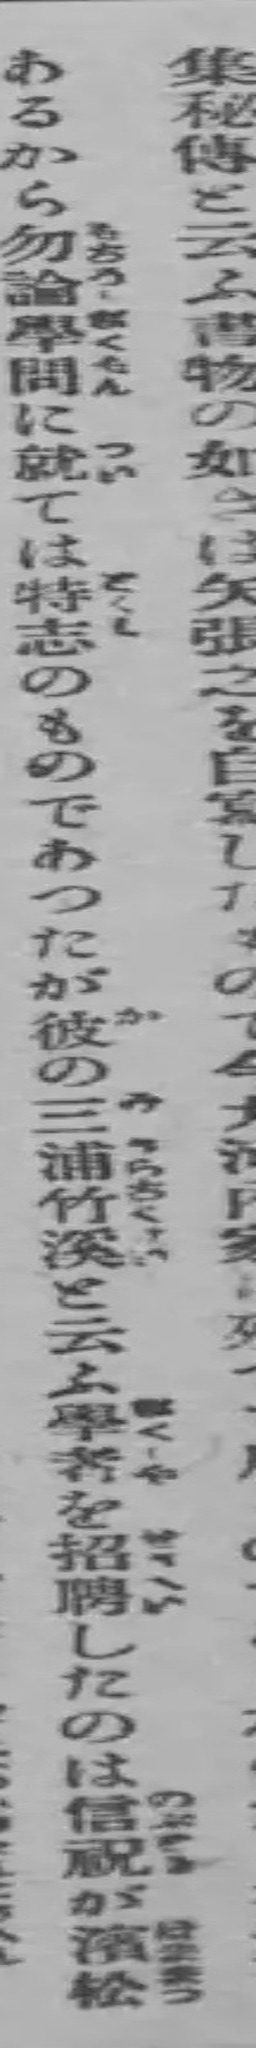三浦竹渓あるから勿論学問に就ては特志のものであつたが彼の三浦竹渓と云ふ学者を招聘したのは信祝が浜松
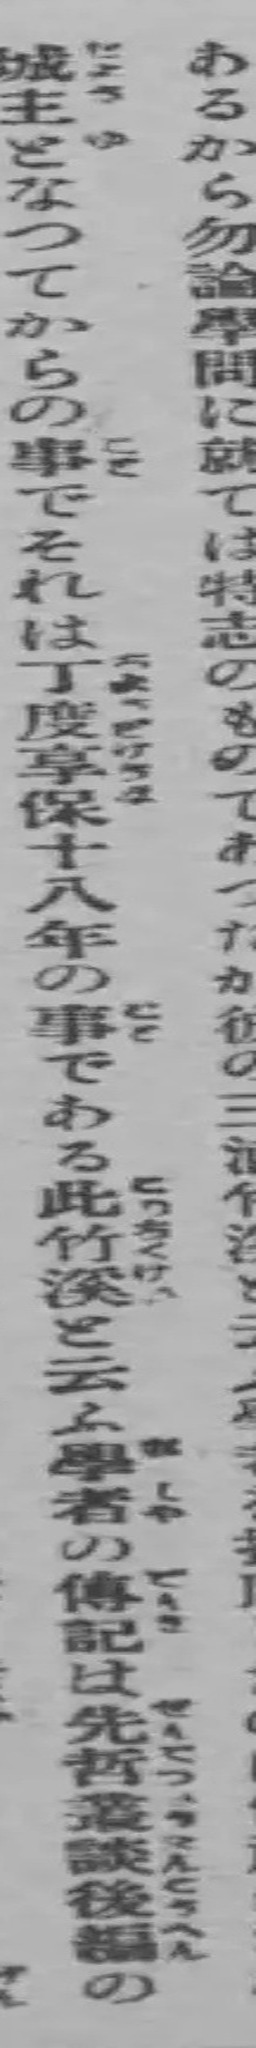城主となつてからの事でそれは丁度享保十八年の事である此竹渓と云ふ学者の伝記は先哲叢談後編の
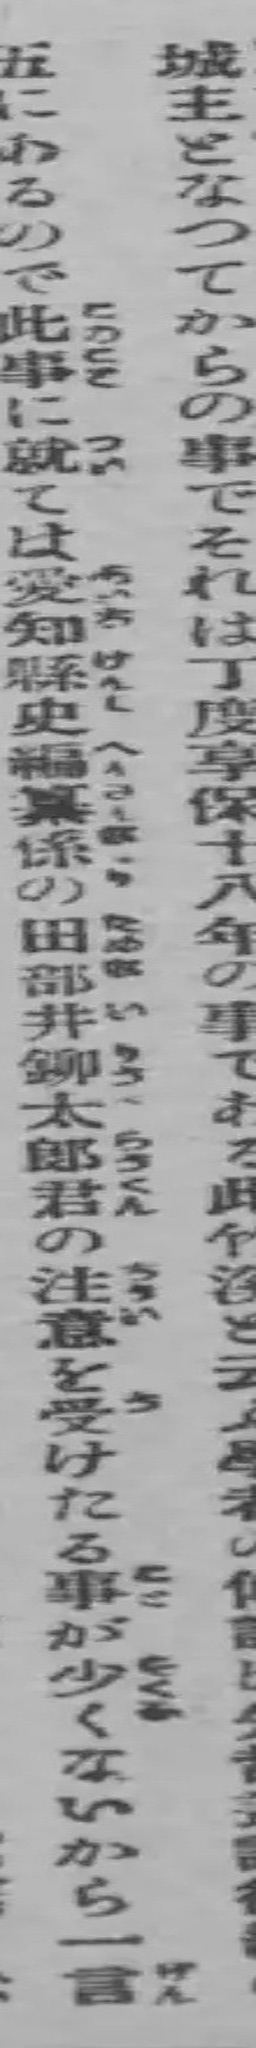五にあるので此事に就ては愛知県史編纂係の田部井鉚太郎君の注意を受けたる事が少くないから一言
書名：豊橋市史談
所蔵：国立国会図書館 National Diet Library, JAPAN
